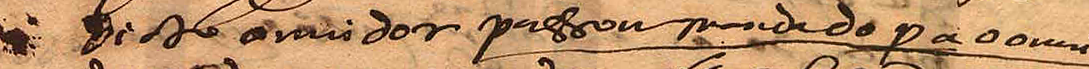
dicto ouuidor passou mandado ꝑa o ouui
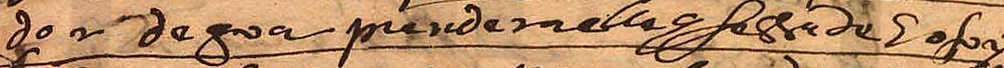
dor de goa prender a elle ꝯfessāte E o foy
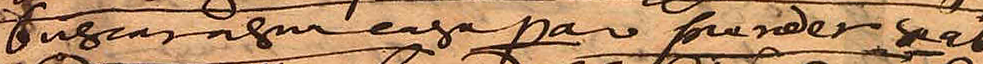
buscar a sua casa ꝑa o prender se ab
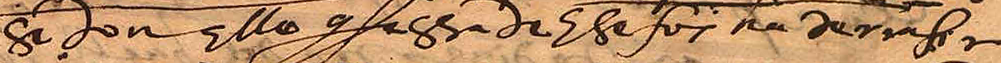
sētou Elle ꝯfessāte E se foj ha terra fir
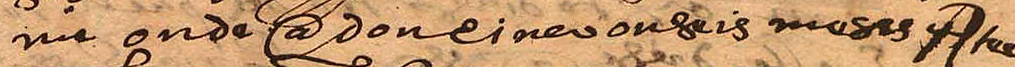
me onde ādou cinco ou seis meses Atee
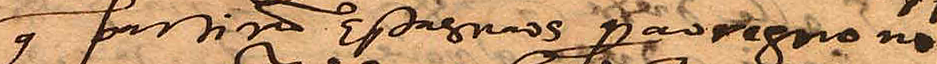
q̄ partirão Estas naos ꝑa o regno no
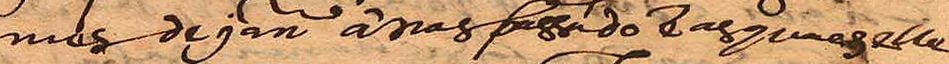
mes de janro ātras passado ē as quaes elle
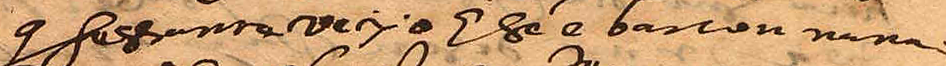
ꝯfessante veyo E se ēbarcou na nao
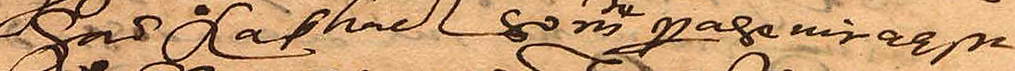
Saõ Raphael somte ꝑa se uir a Este
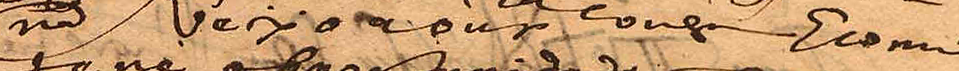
nā veyo a outra cousa E como
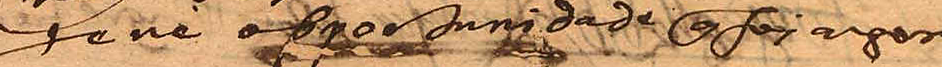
teue opportunidade q̄ foj agora
